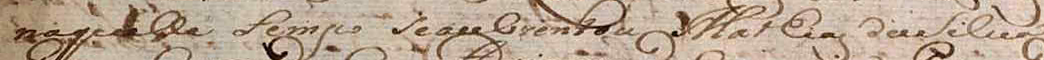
naquelle tempo se aubzentou Mathias da Silua
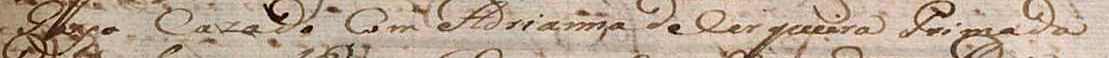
Gayo Cazado Com Adrianna de Cerqueira Prima da
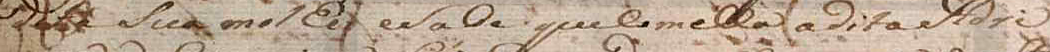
dita sua molher, e sabe que com ella a dita Adri
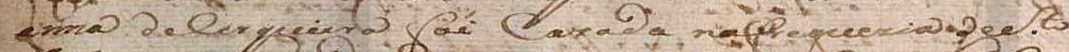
anna de Cerqueira foi Cazada na Freguezia de S.to
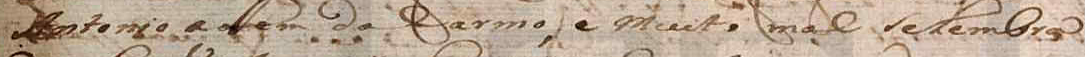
Antonio aLem do Carmo, e muito mal se lembra
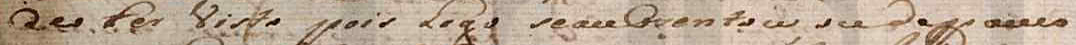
de o ter Visto pois Logo se aubzentou, so depoues
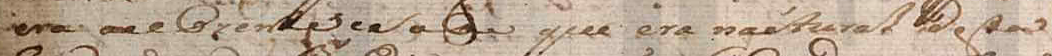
era aubzente e sabe que era natural desta
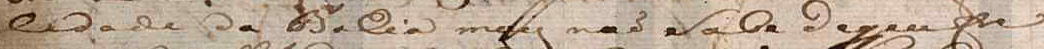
Cidade de Bahia mais naõ sabe de que fre
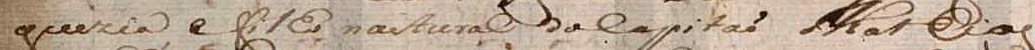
guezia e filho natural do Capitaõ Mathias
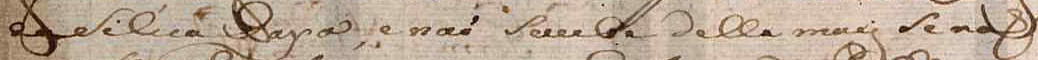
da Silua Gaya, e naõ soube della mais se naõ
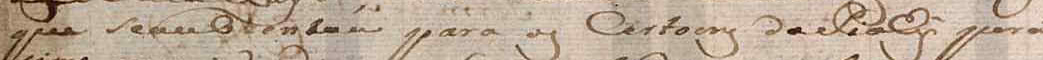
que se aubzentou para os Certoens do Piahy por a
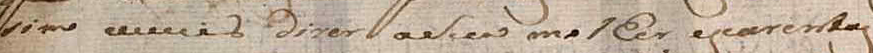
sim ouuir dizer a sua molher e parentas
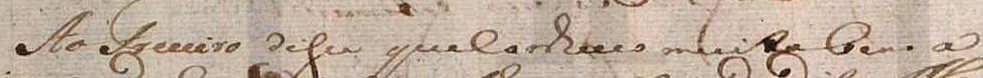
Ao Terceiro disse que Conheceo muito bem a
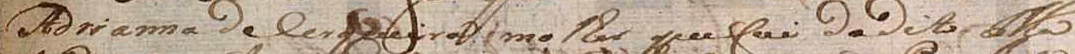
Adrianna de Cerqueira molher que foi do dito Ma
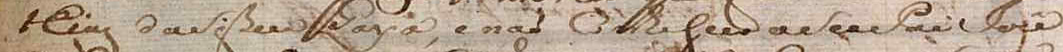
thias da Sjlua Gaya, e naõ Conhesseo a seu Pai Iozê
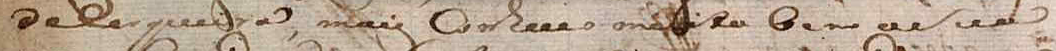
de Cerqueira, mais conheceo muito bem a sua
